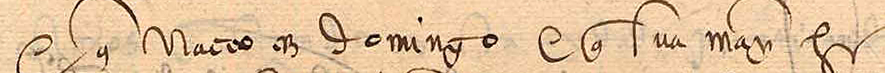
e q̄ naceo em domingo e q̄ sua maȳ he
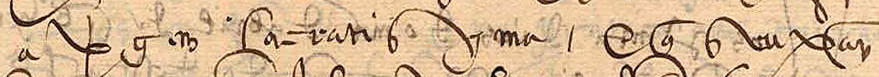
a Ꝟgem sacratisyma / e q̅ seu pay
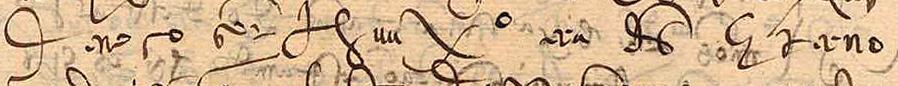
de noso so̅r Jhuu Xo era d̅s Eterno
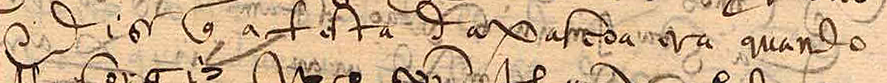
e dise q̅ a festa da pascoa era quando
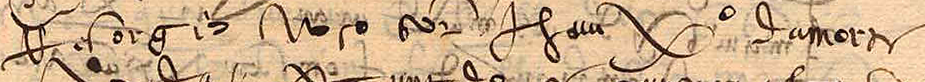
Resorgio Noso so̅r Jhuu Xo da morte
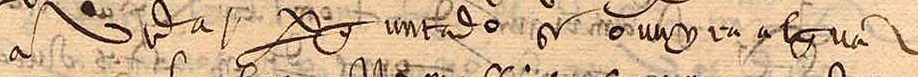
a Vida / ꝑguntado se ouuyra alguā
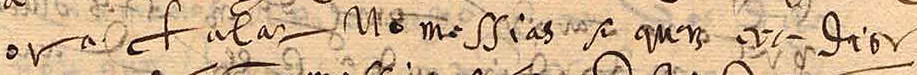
ora falar no messias se quem era dise
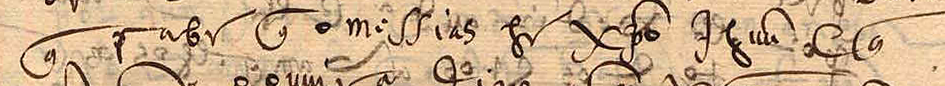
q̅ sabe q̅ o messias he Xp̅o Jhuu̅ e q̅
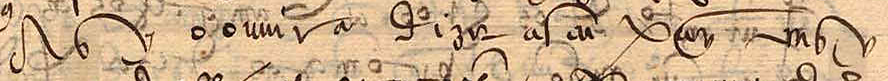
Asy o ouuira dizer a seu pay emsy
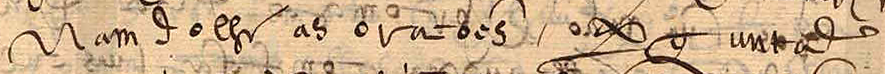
Namdolhe as oracoes̄ / ꝑguntado
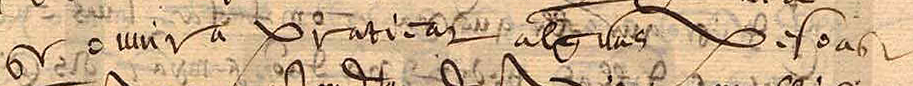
se ouuira praticar algu̅as pesoas
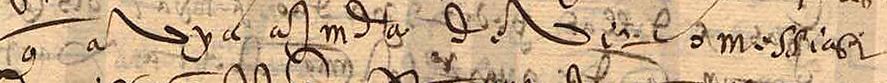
q̅ avya aJmda de Vir o messias
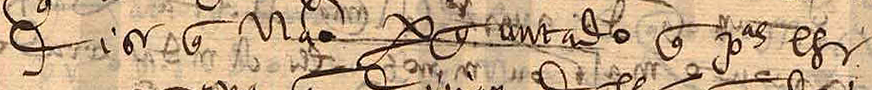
dise q̅ não ꝑguntado q̅ pas lhe
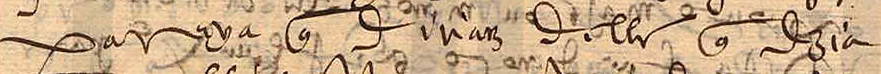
parecya q̅ diriam delle q̅ dezia
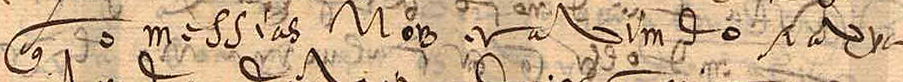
q̅ o messias nom era vimdo e avya
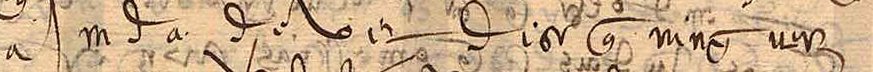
aJmda de vir dise q̅ ninguem
